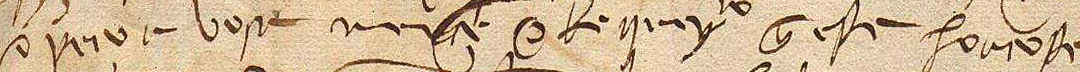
e peço a vosa merçe e Requeyro q̄ este ho acoste
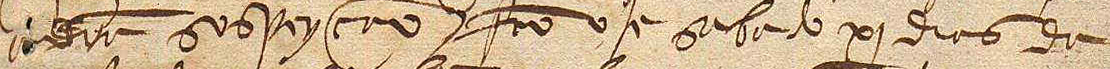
a dita sospeyção / f̄co oJe sabado xj dias da
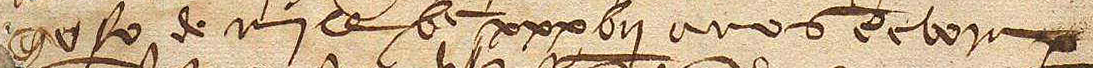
gosto de mjll bc xxx bij anos ē evora ꝑ
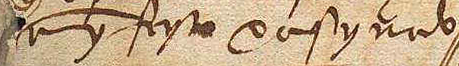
mȳ feyto e asynado
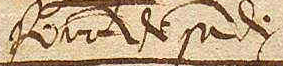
fernā de s̄ade
